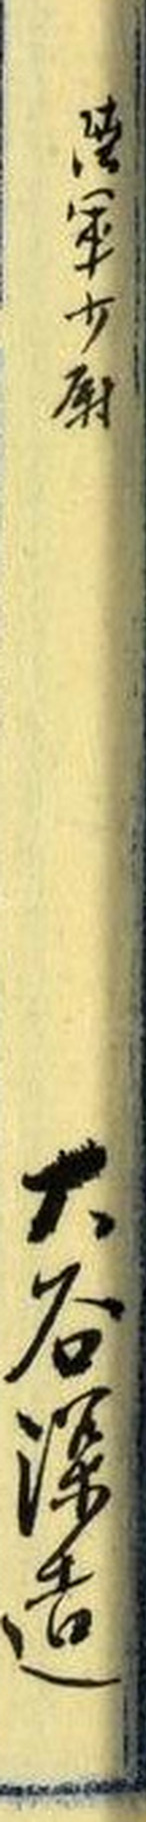陸軍少尉大谷深造

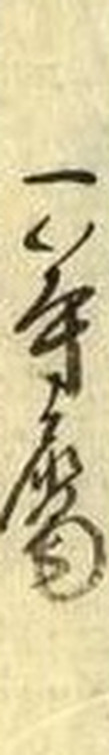一等属
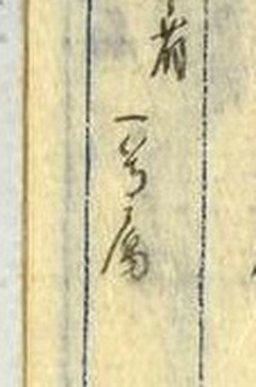一等属

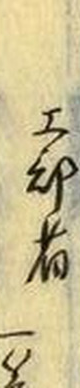工部省
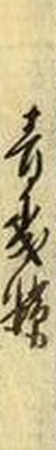青森県
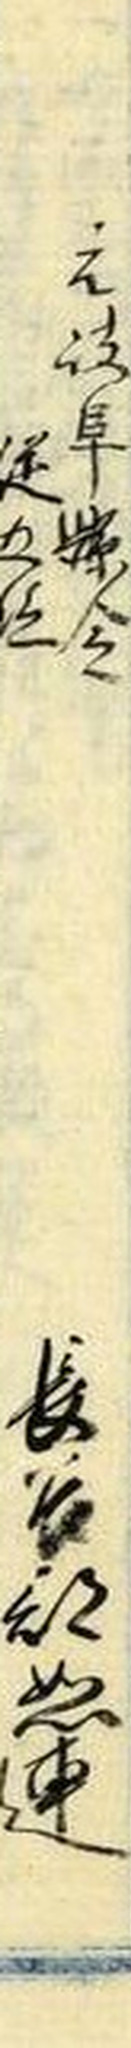従五位長谷部恕連
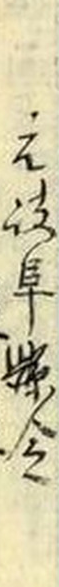元岐阜県令
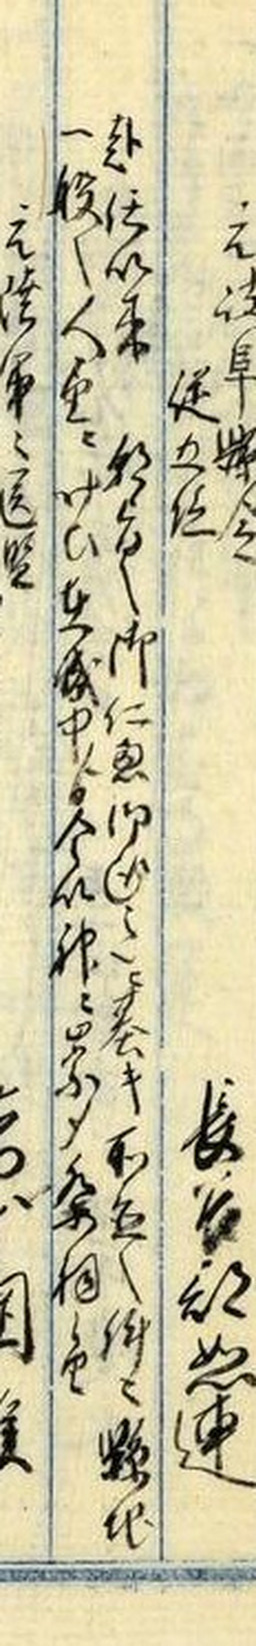赴任以来朝旨之御仁恵御趣意ニ基キ所置之件ニ県地
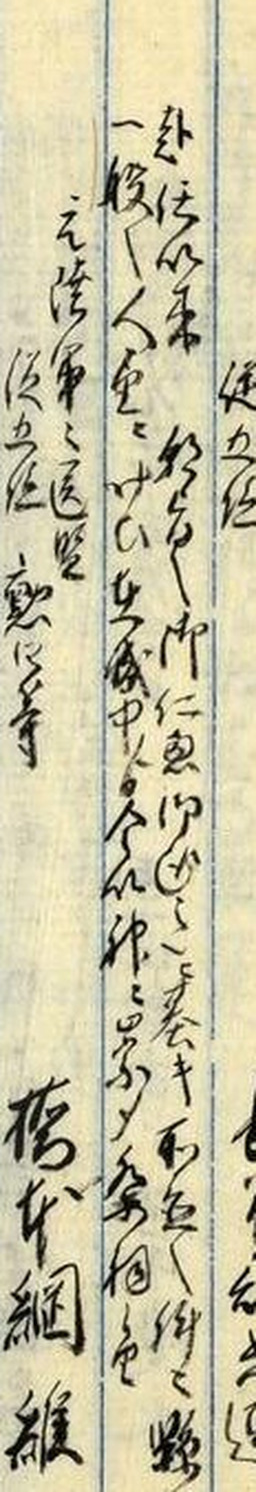一般之人望ニ叶ひ在職中ゟ今以神ニ崇メ祭祠之由
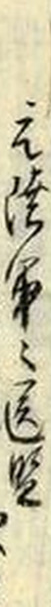元陸軍々医監
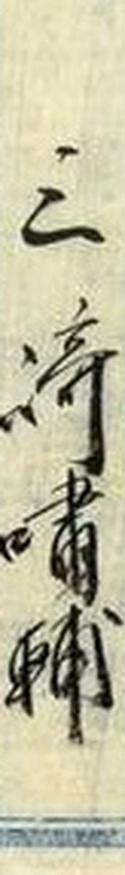三崎嘯輔
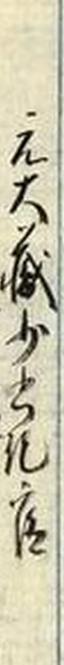元大蔵少書記官
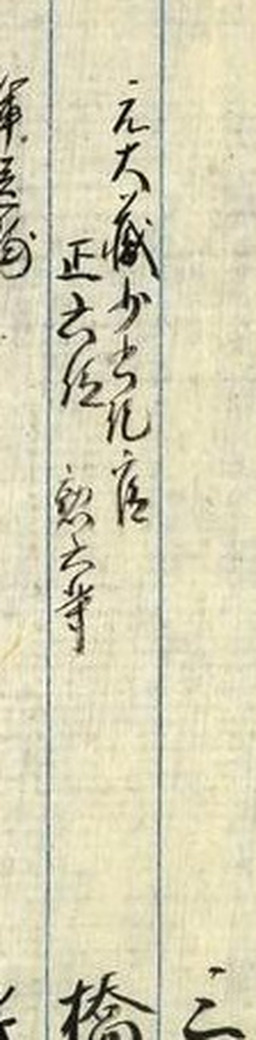元大蔵少書記官
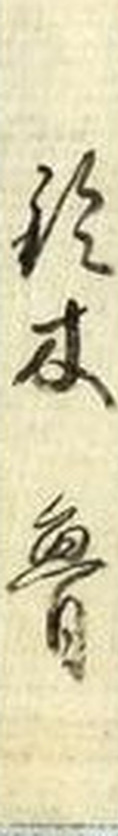鈴木魯
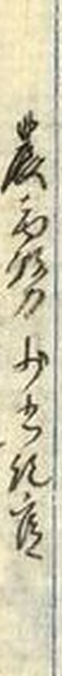農商務少書記官

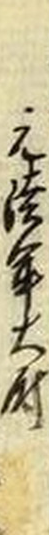元陸軍大尉
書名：温古集 三巻
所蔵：福井県文書館 Fukui Prefectural Archives
